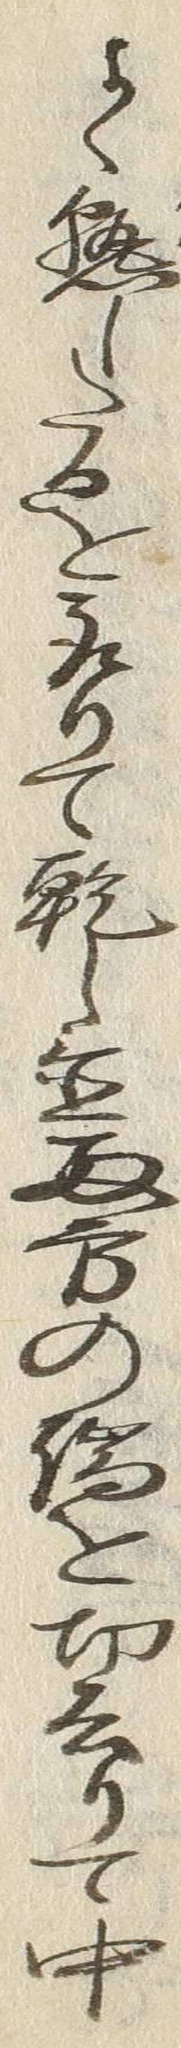よく熟したるを取りて乾し置両方の端を切去りて中
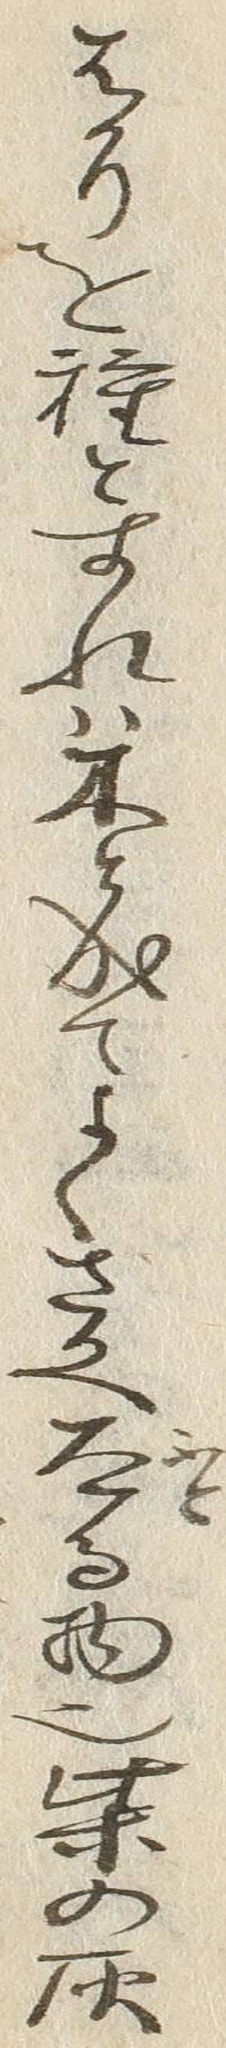はかりを種とすれは木と成てよくさかへ太る物也柴の灰
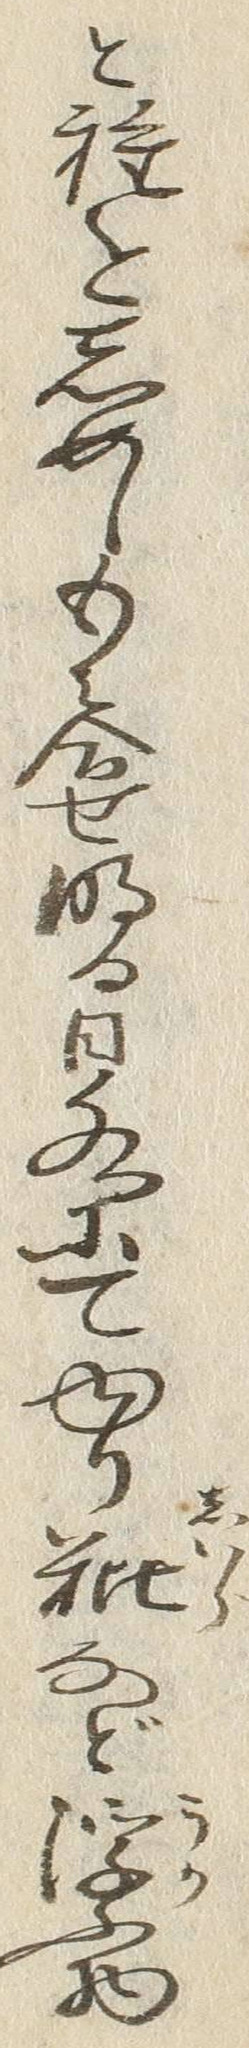と種を志めしもみ合せ明る日水尓てゆり粃など浮ふ物
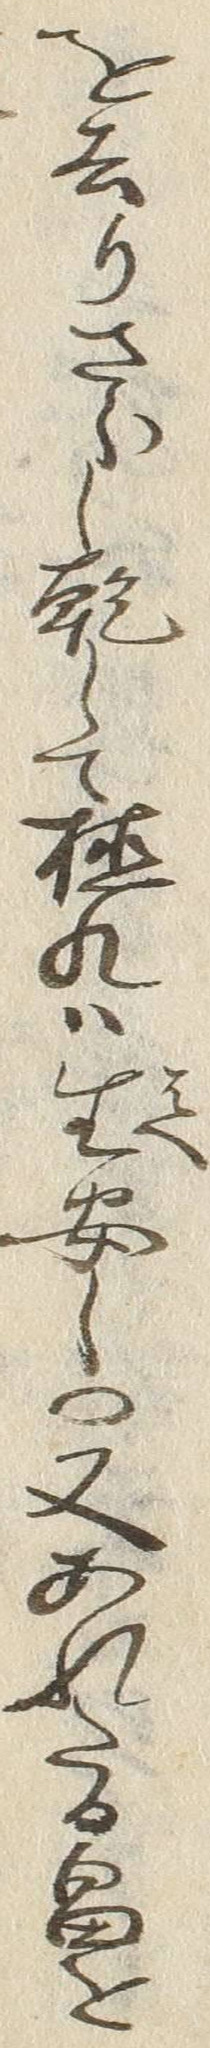を去りさらし乾して植れは生安し〇又あれたる畠を
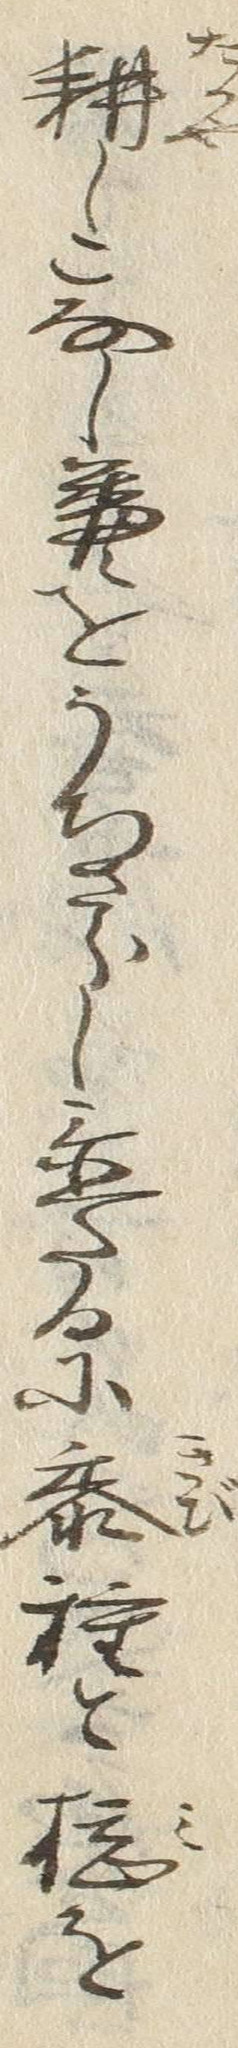耕しこなし糞をうちさらし置たる尓黍種と椹を
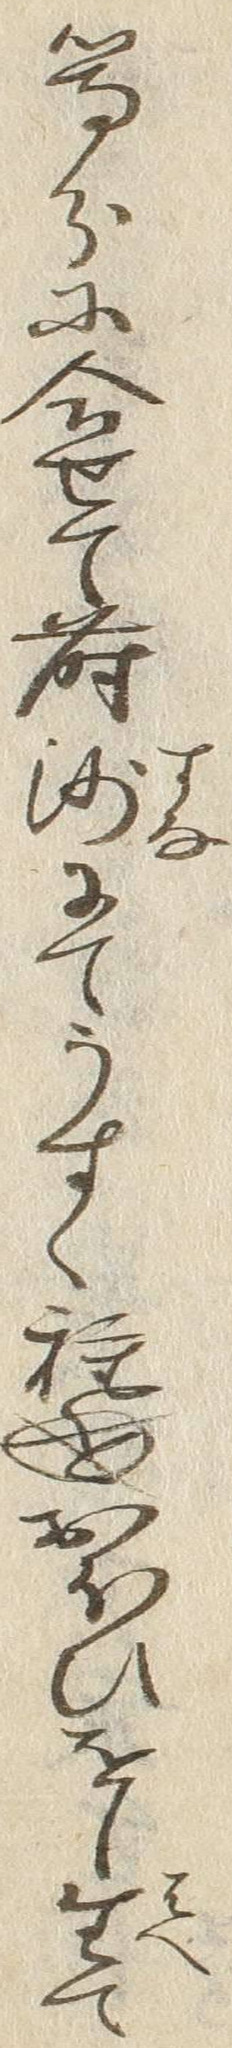等分尓合せて蒔沙尓てうすく種お不ひをし生て
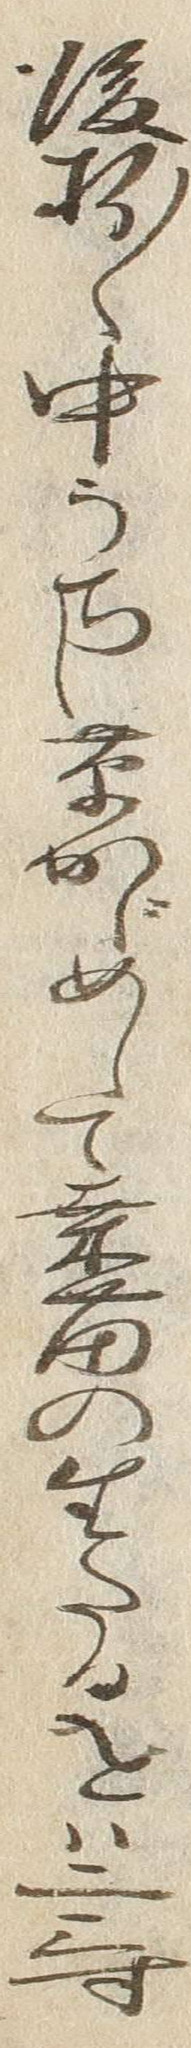後折々中うちし草かじめして桑苗の生たるをは二三寸

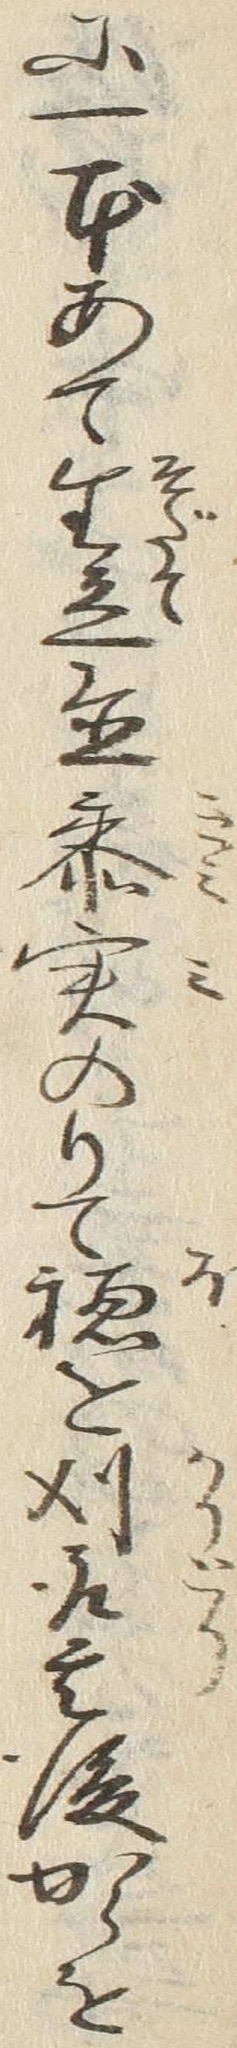尓一本あて生立置黍実のりて穂を刈取其後がらを
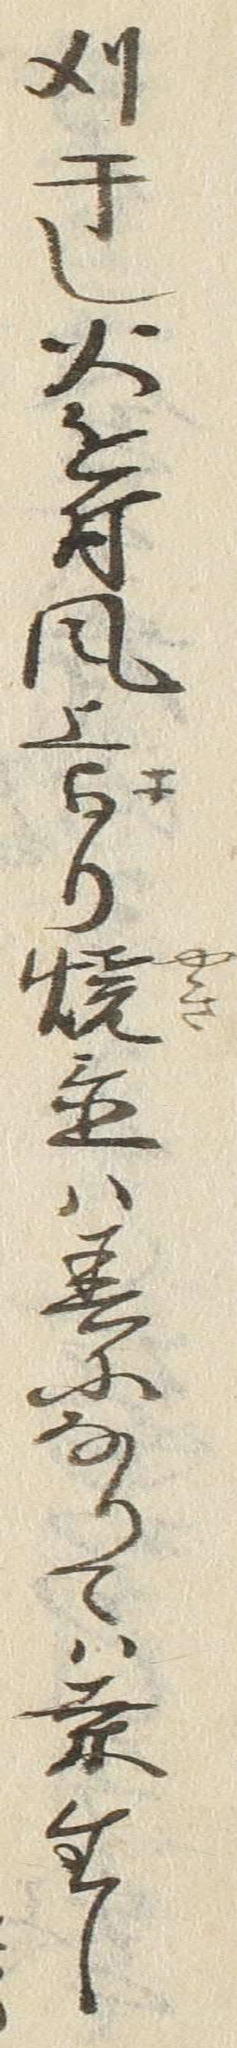刈干し火を付風上与り焼置は春尓なるては桑生し
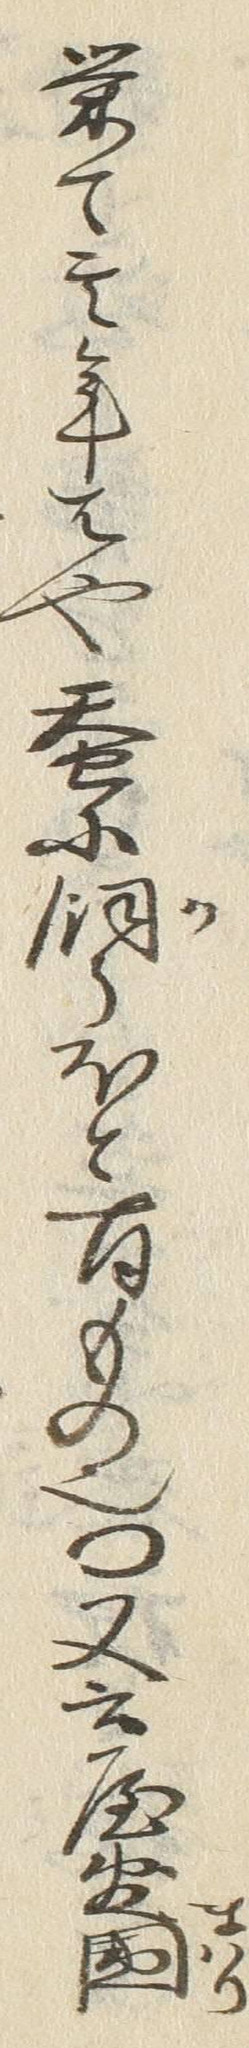栄て其年はや蚕尓飼う不と有もの也〇又云屋敷囲
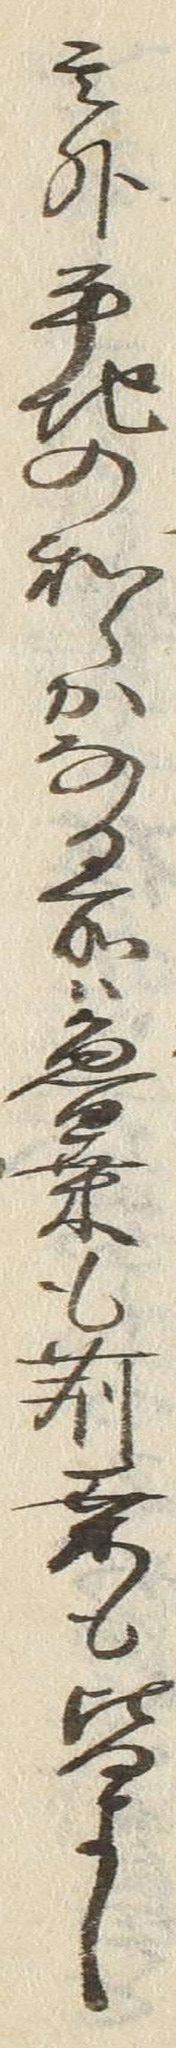其外平地の和らかなる所は魯桑も荊桑も皆よし
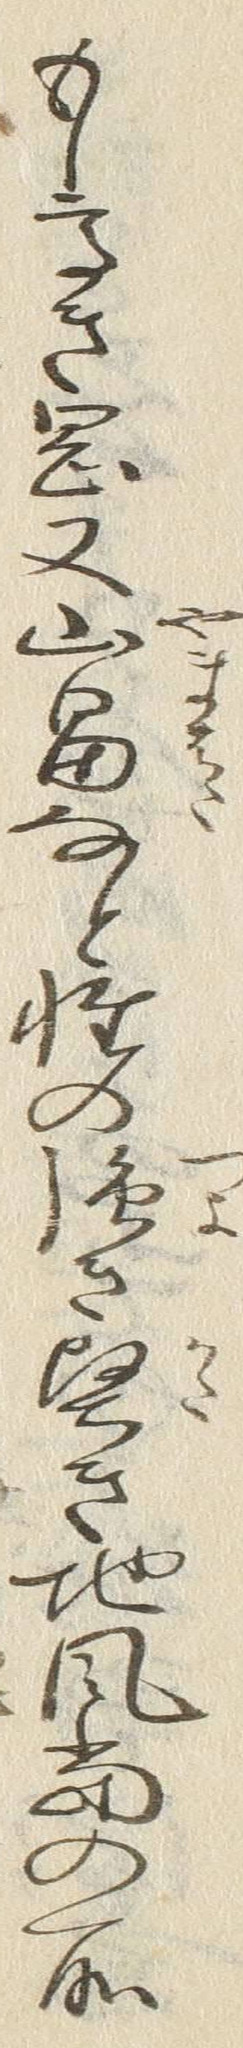もし高き岡又山畠なと性の強き堅き地風当の所
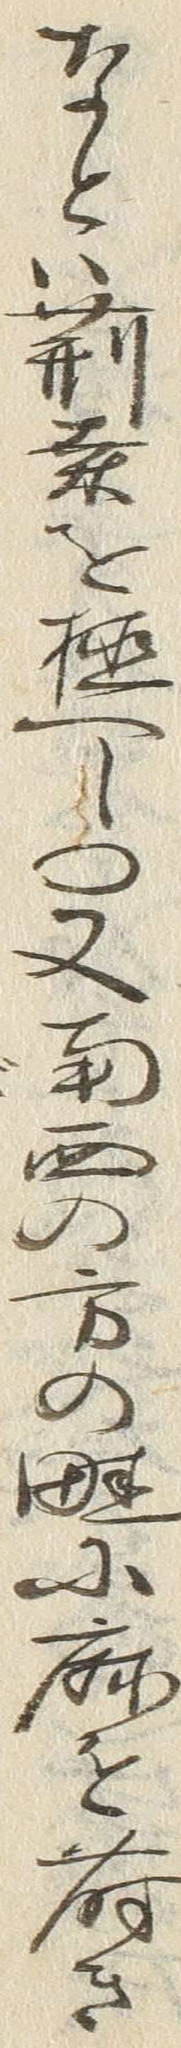なとは荊桑を植へし〇又南西の方の畦尓麻を蒔き
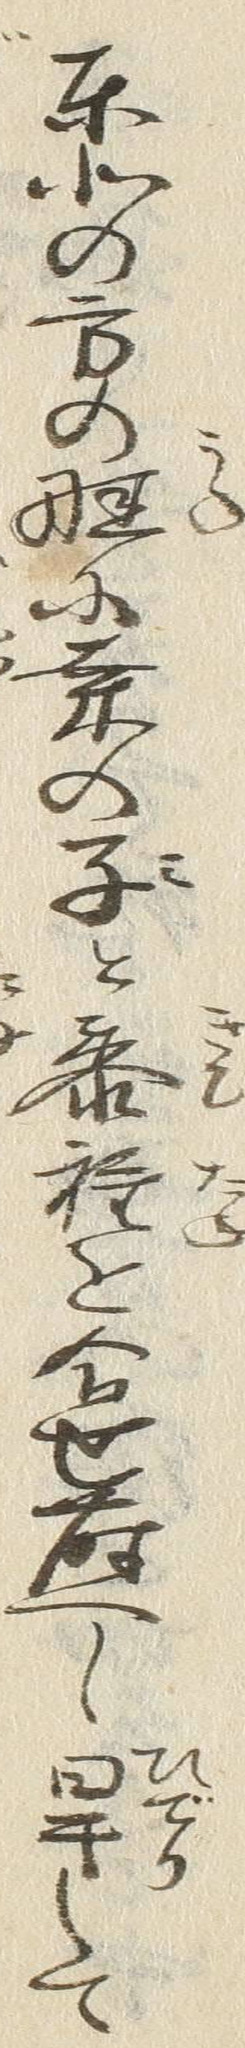東北の方の畦尓桑の子と黍種を会い合せ蒔へし旱して
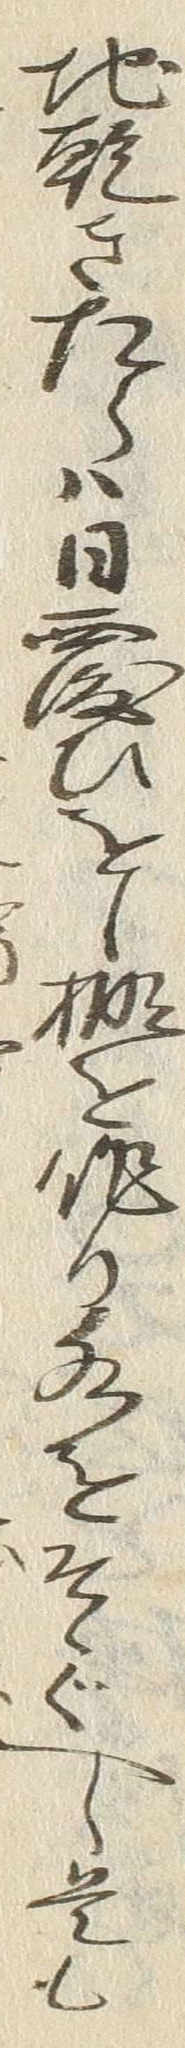地乾きたらは日覆ひをし棚を作り水をそゝぐへし是も
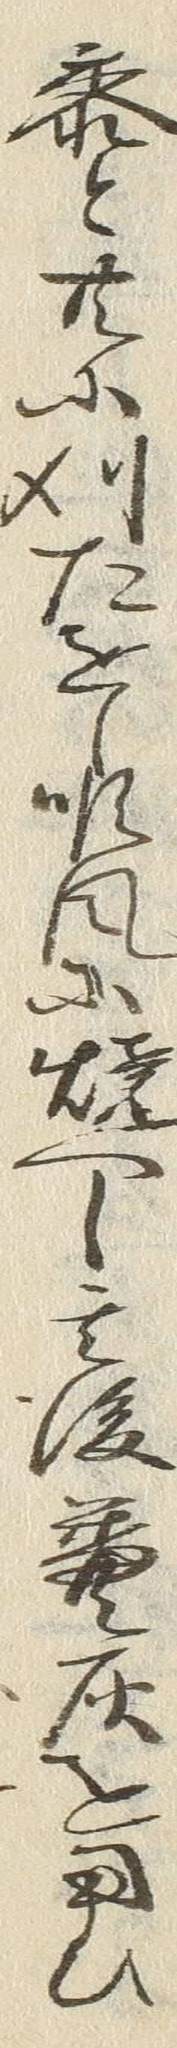黍と共尓刈たをし順風尓焼へし其後糞灰を用ひ
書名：養蠶實驗録後編
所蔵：東京大学農学生命科学図書館 国文学研究資料館
